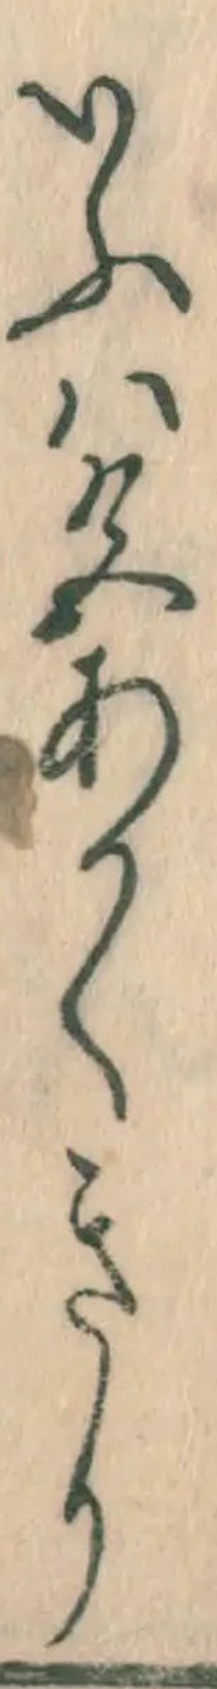いふは色あかくきり
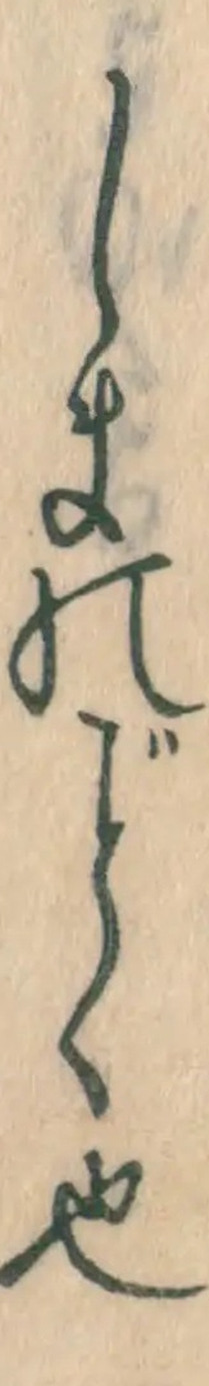しまのごとく也

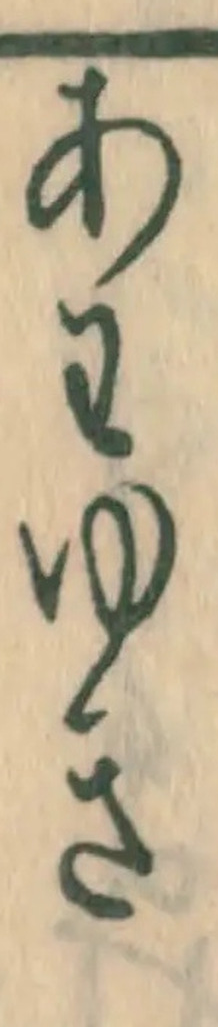あわゆき
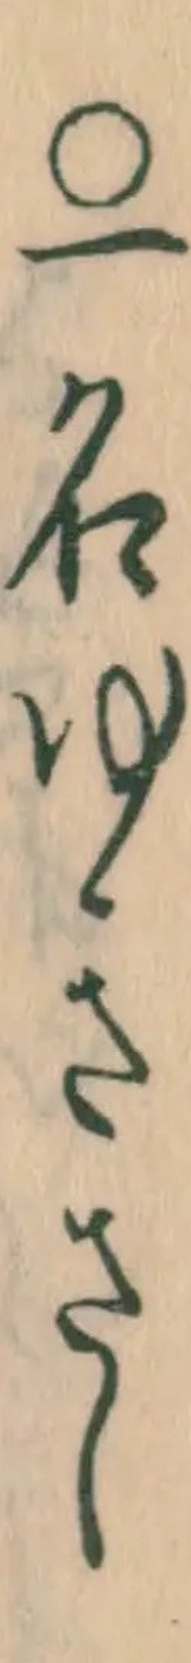○一名ゆきさゝ
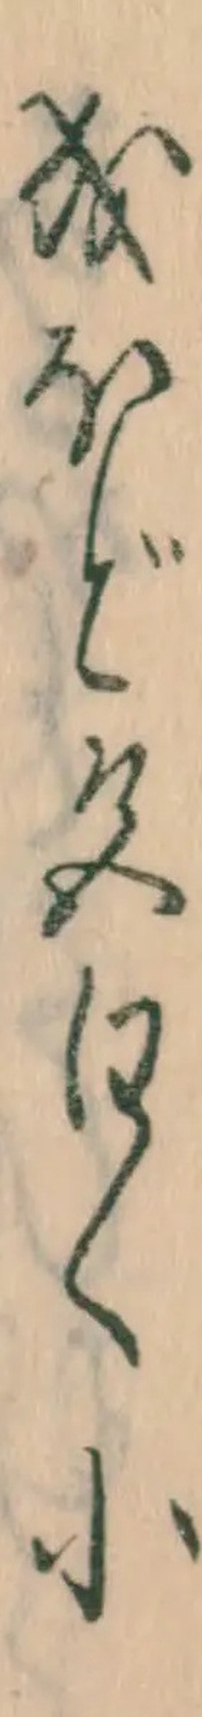成ほど色白く小
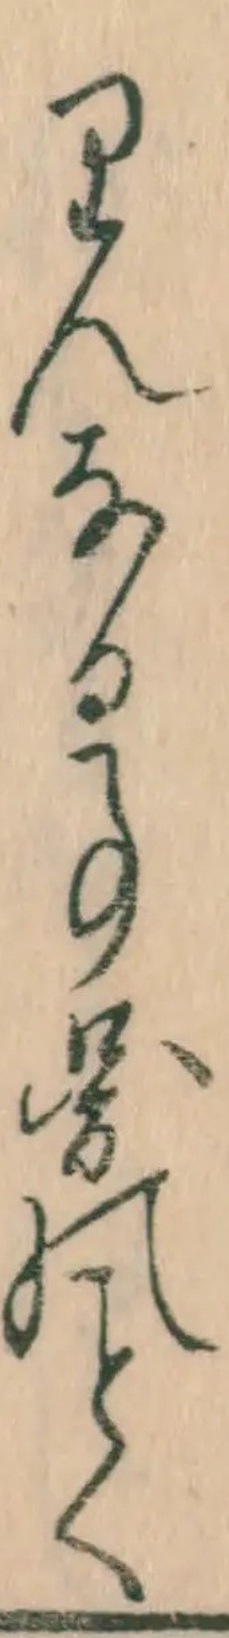りんなる事図のことく
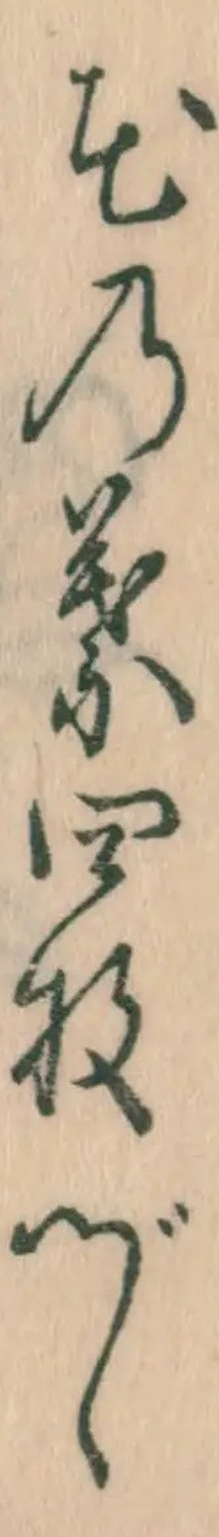花の葉四枝づゝ
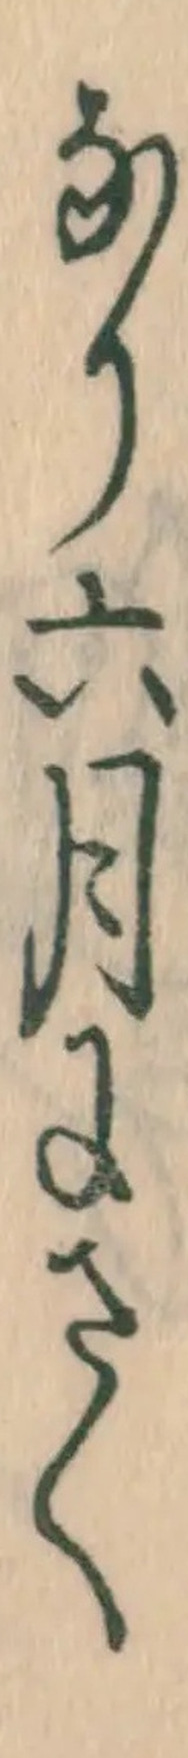なり六月にさく
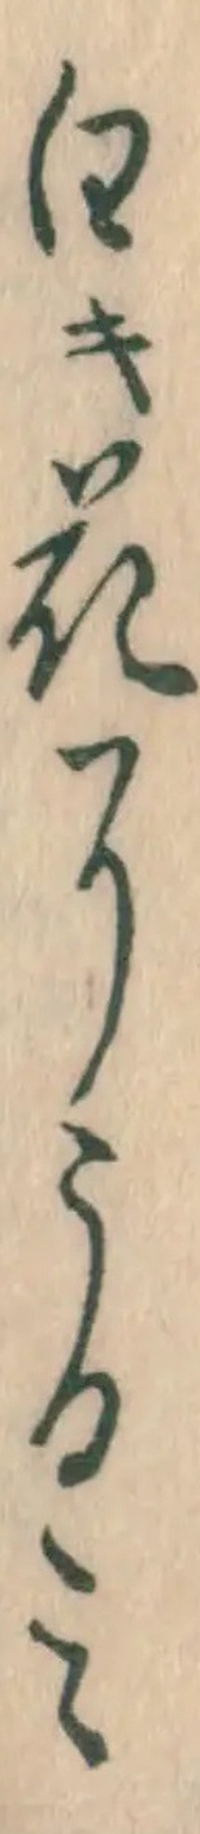白き花にうるみ
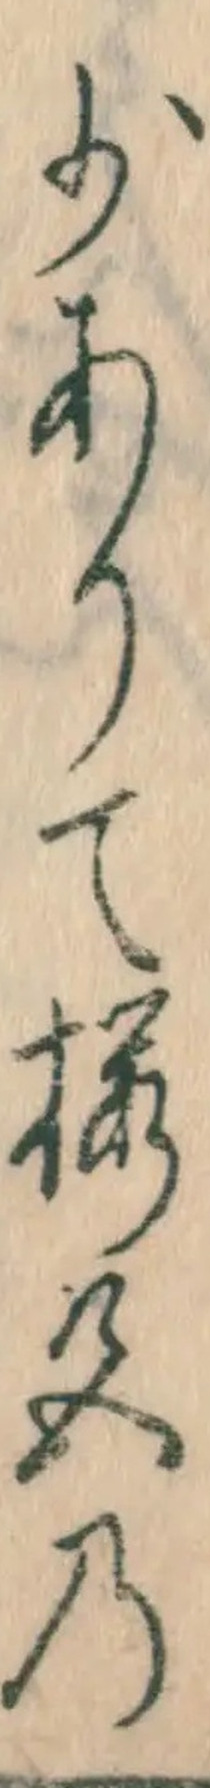少ありて桜色の
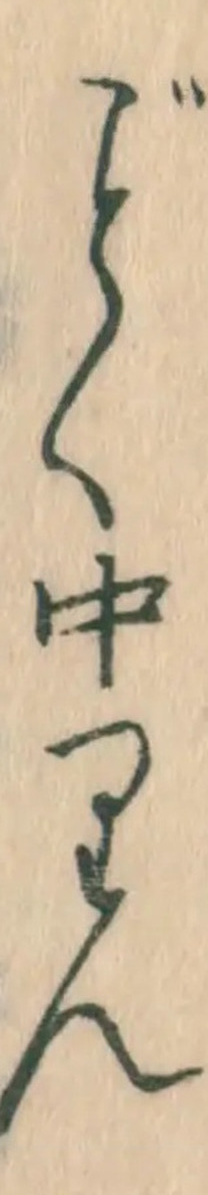ごとく中りん

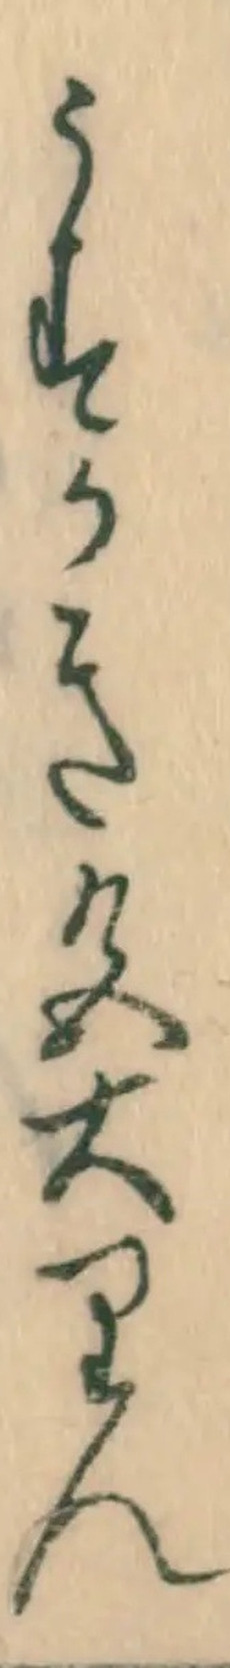うすかき色大りん
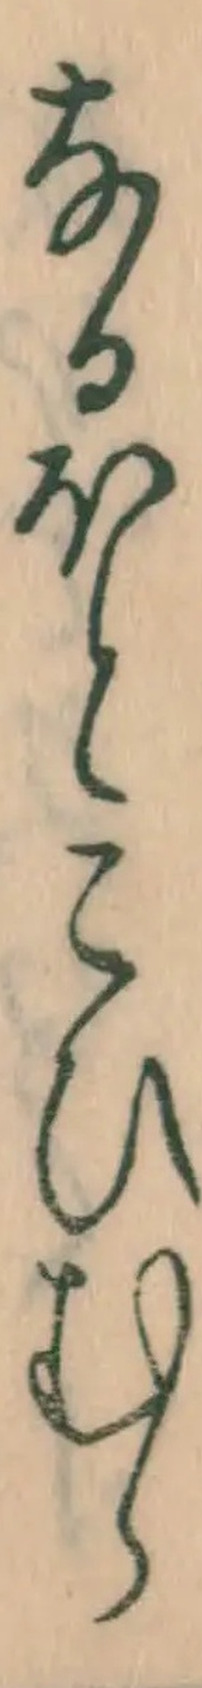なるほとこひむら
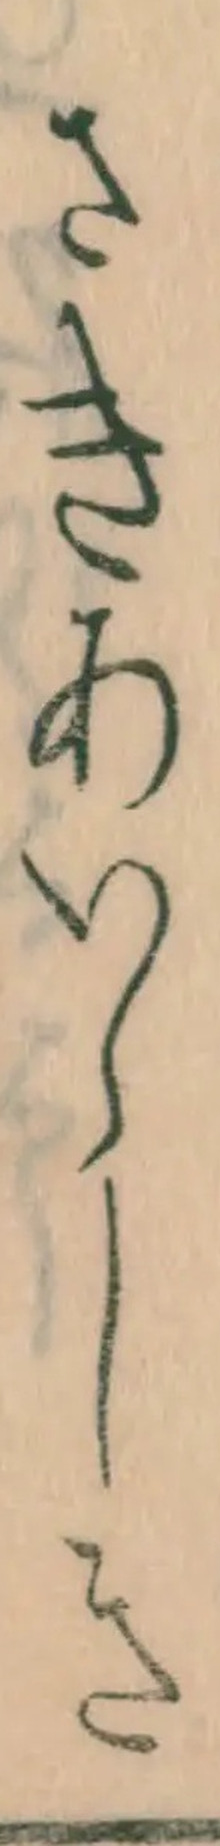さきあいらしき
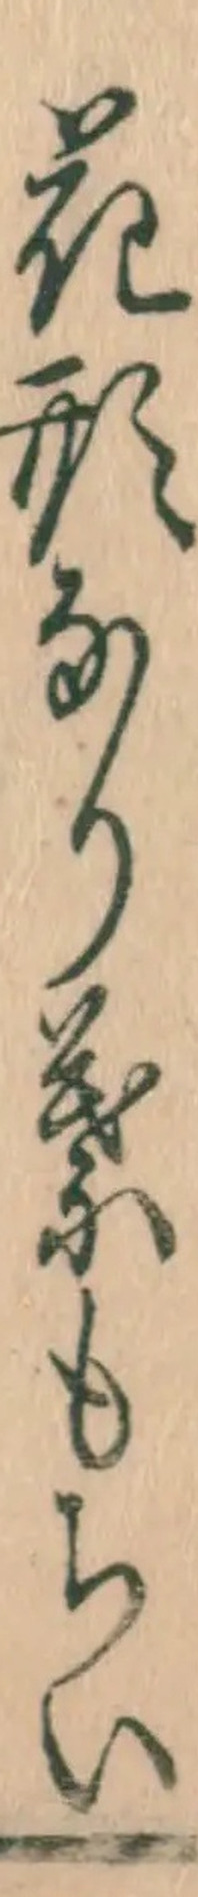花形なり葉もちい
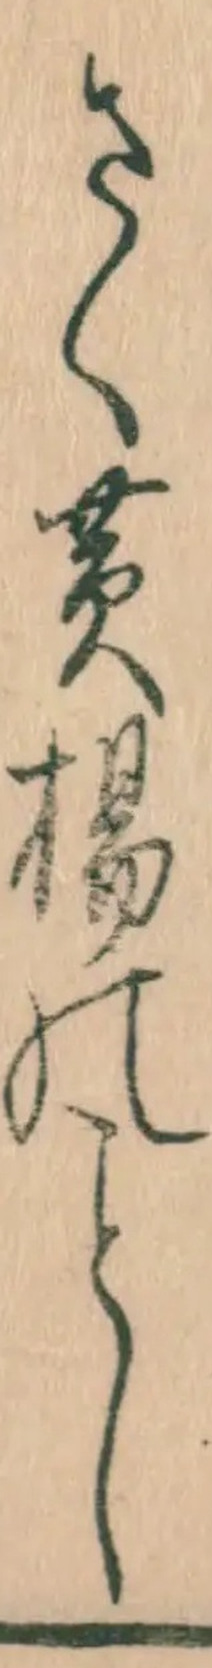さく黄楊のことし
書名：錦繍枕 5巻. [2]
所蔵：国立国会図書館 National Diet Library, JAPAN
